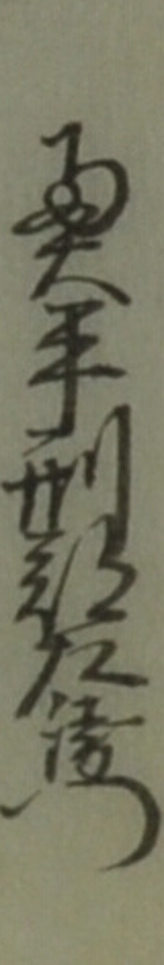奥平刑部左衛門
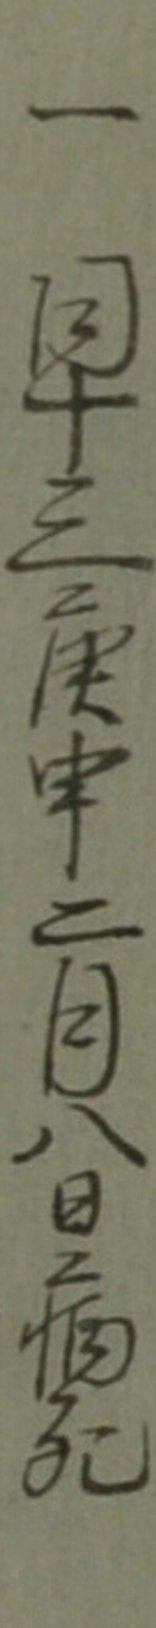一同十三庚申二月八日病死
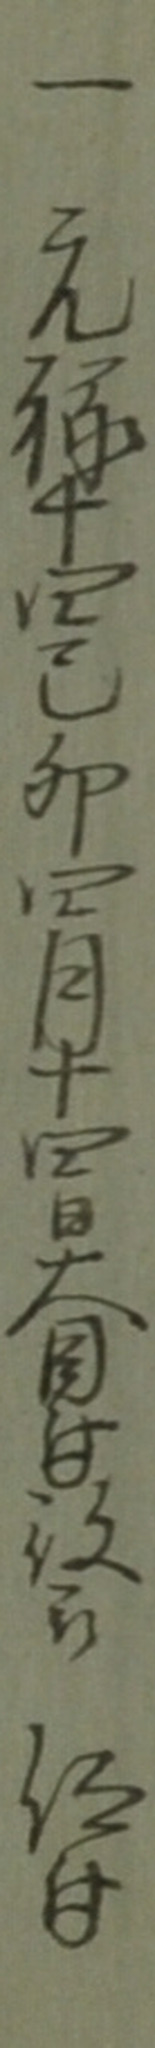一元禄十四己卯四月十四日大目付被仰付
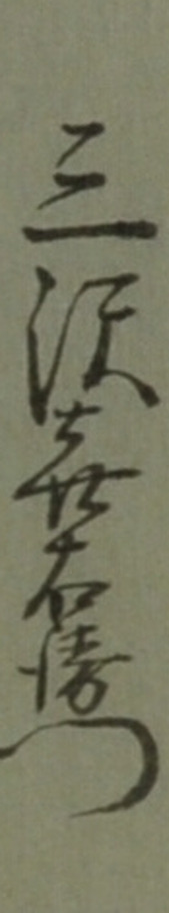三沢喜右衛門
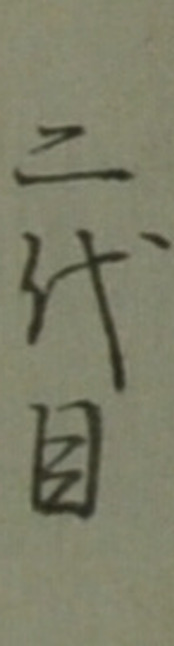二代目
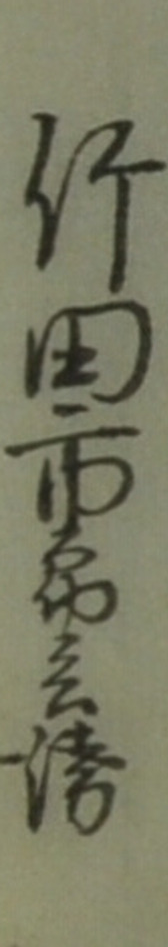竹田市郎兵衛
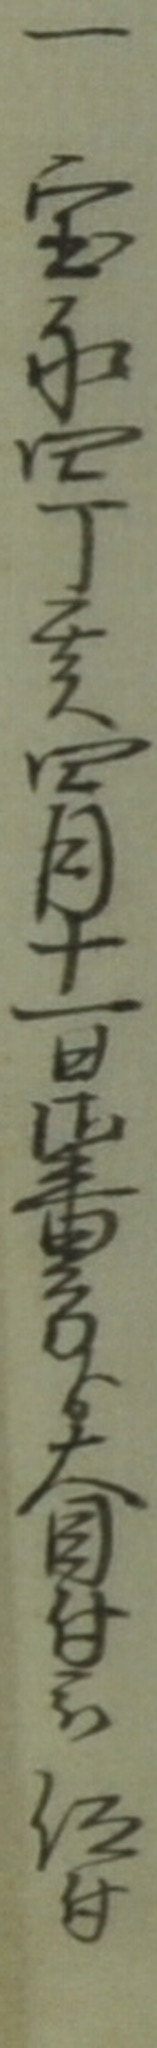一宝永四丁亥四月十一日御番方ゟ大目付被仰付

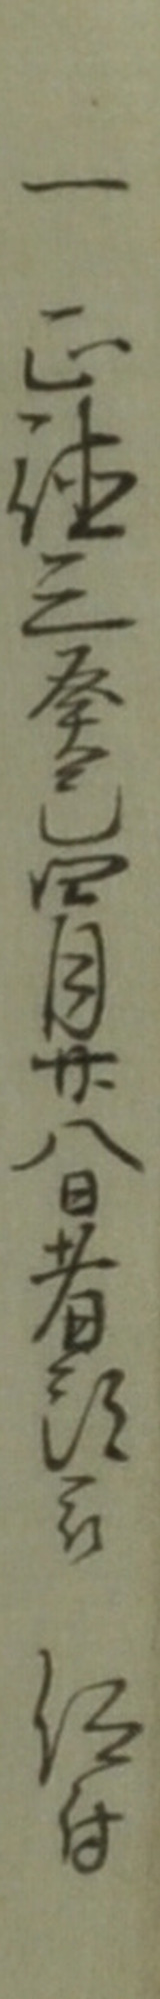一正徳三癸巳四月廿八日者頭被仰付
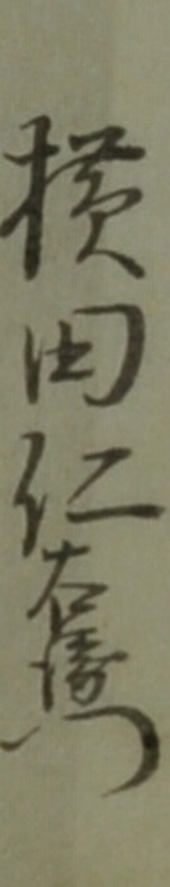横田仁右衛門
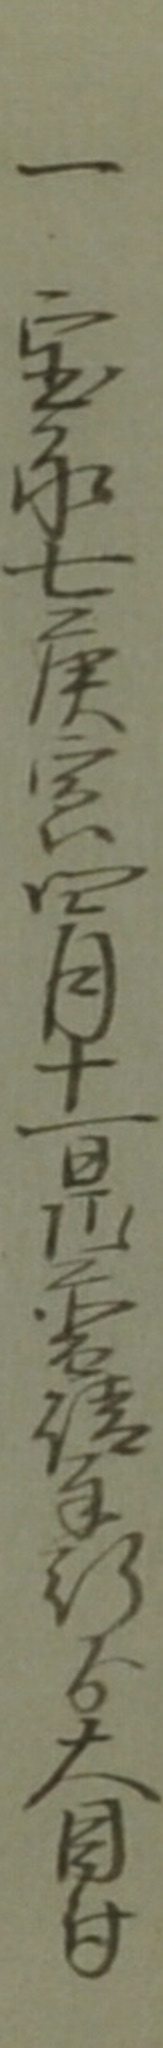一宝永七庚寅四月十一日御普請奉行ゟ大目付
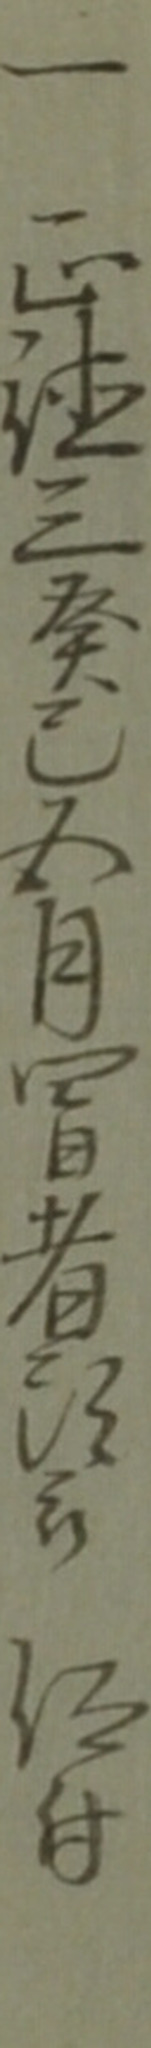一正徳三癸巳五月四日者頭被仰付
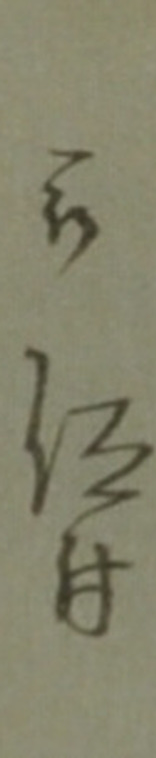被仰付
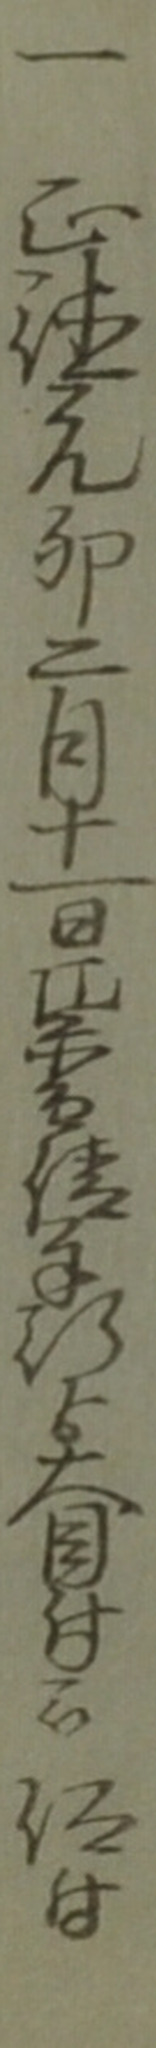一正徳元卯二月十一日御普請奉行ゟ大目付被仰付
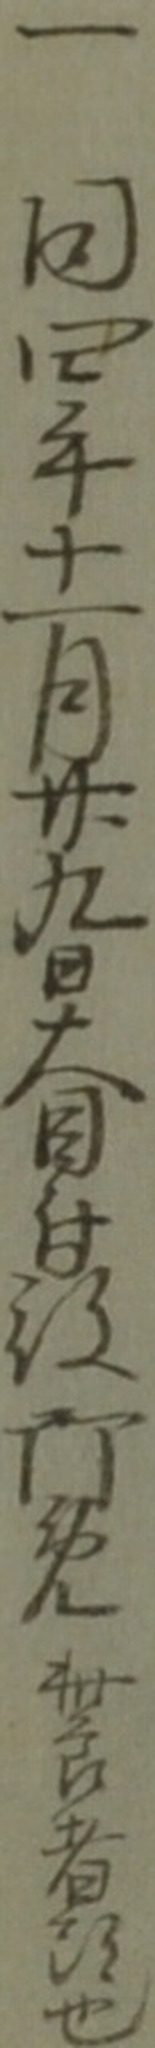一同四午十一月廿九日大目付役御免此節者頭也
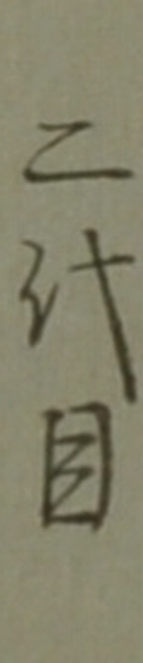二代目
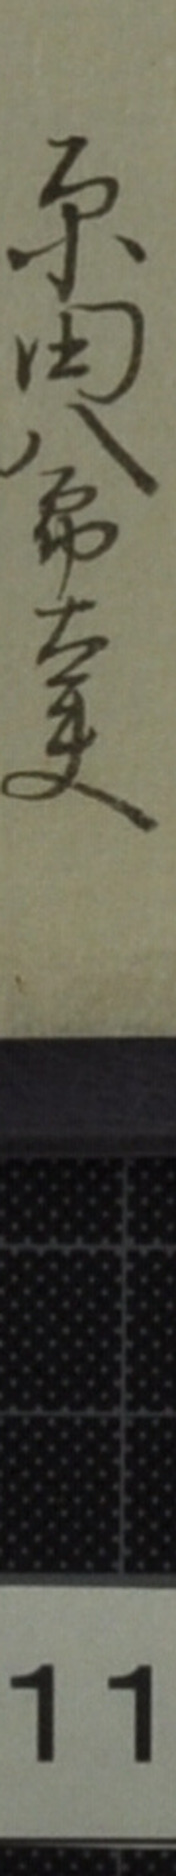原田八郎太夫
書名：諸御役代々録（三）
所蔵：伊那市立高遠町図書館・合同会社AMANE
